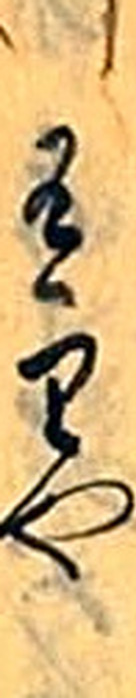有りや
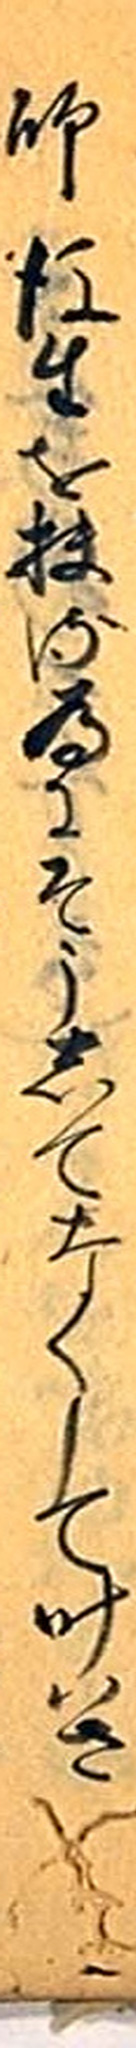師後生を扶る為にそうしてなくして叶はさ
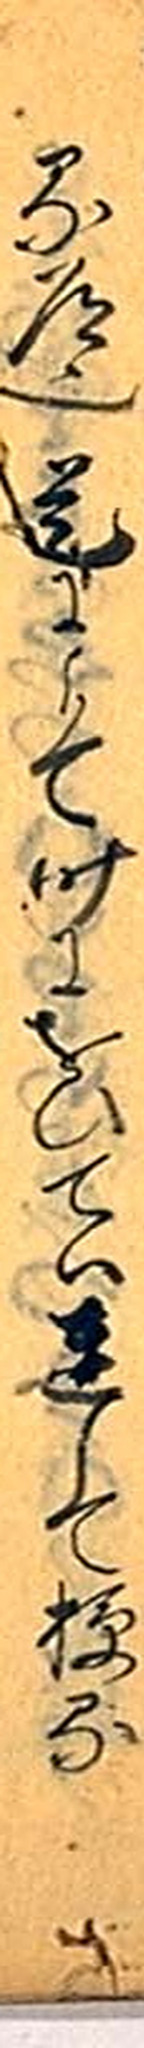る道也是によて叶にをひては達して授る
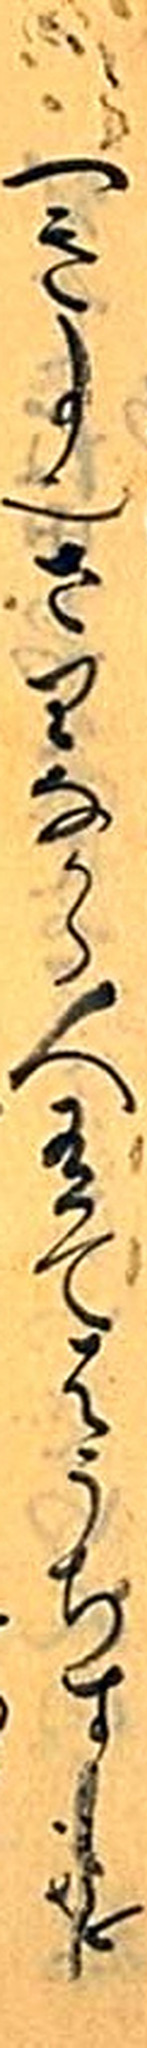へき事也さりなから人有てはうちすもを
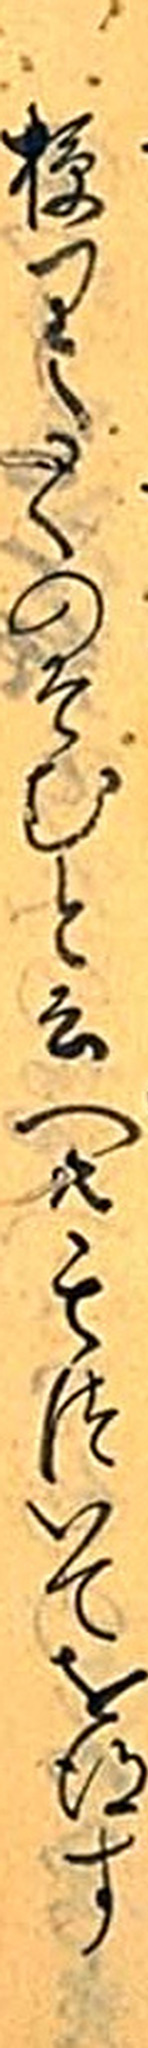授りたくのそむと云へ共其ついてを得す
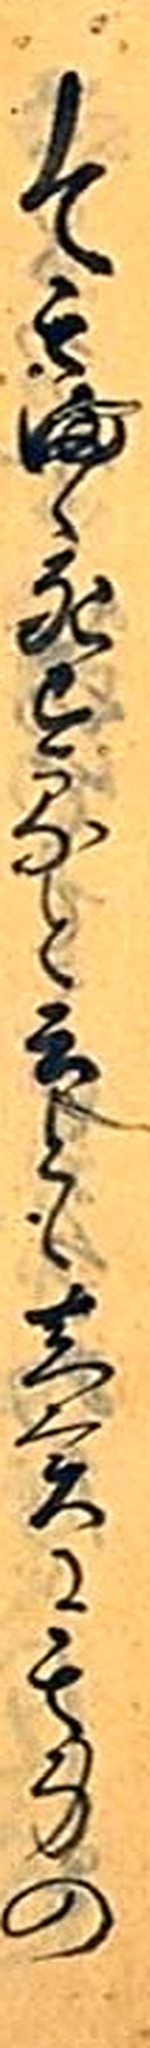して其まゝ死すると云とも真実に其身の
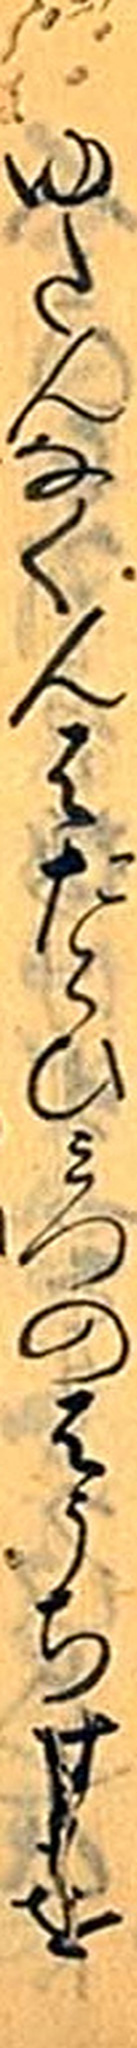ゆたんなくんはたとひみつのはうちすもを
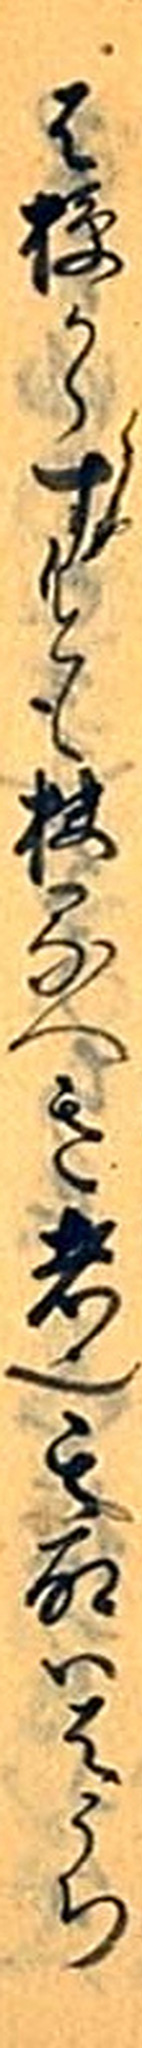は授からすとも扶るへき者也其故ははうち
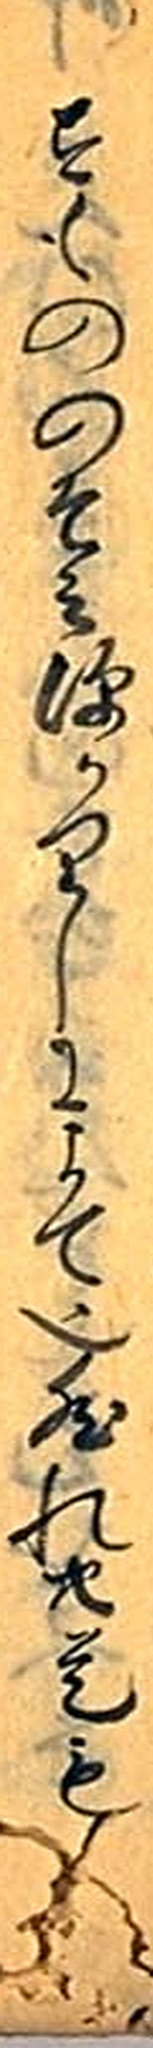すもののそみ深かりしによて也然れ共是も
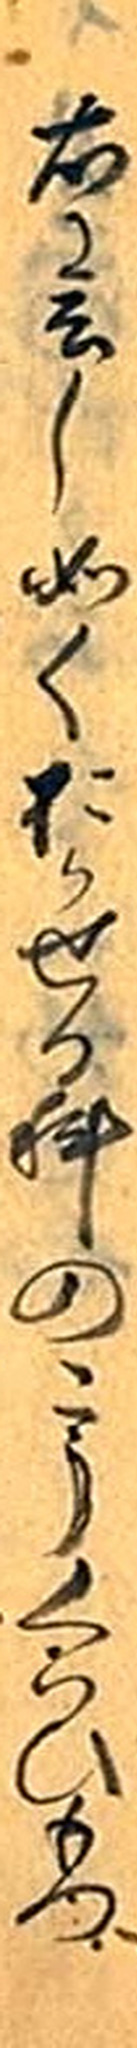右に云し如くおかせる科のこうくはひもつ
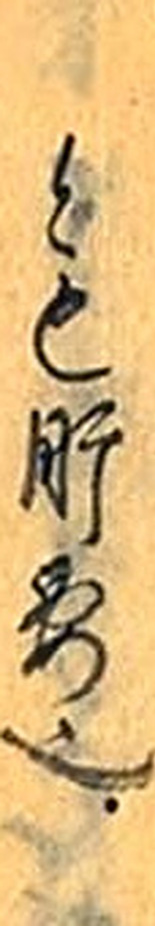とも肝要也
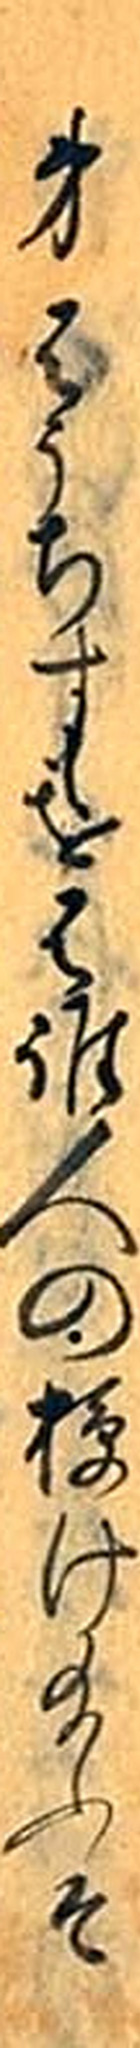弟はうちすもをは誰人の授け給ふそ
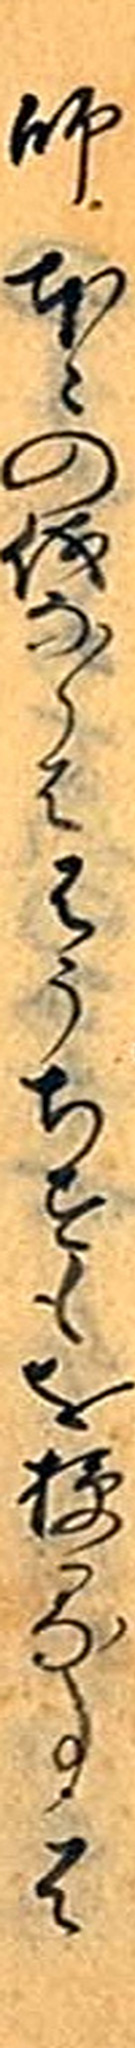師本々の儀ならははうちすもを授る事は
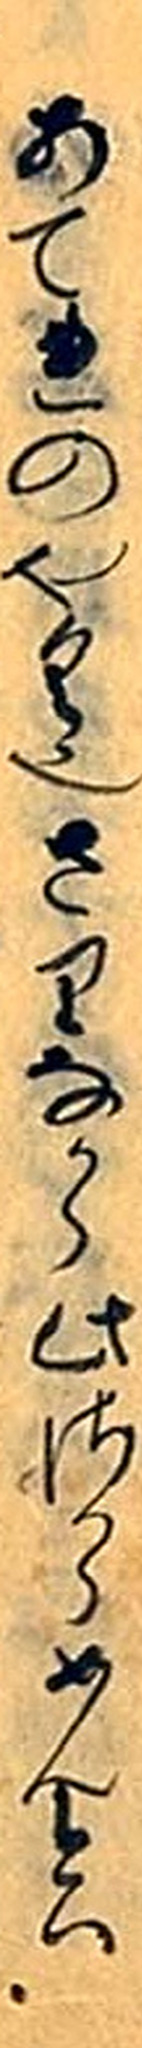あてれのやく也さりなからこのさからめんとは
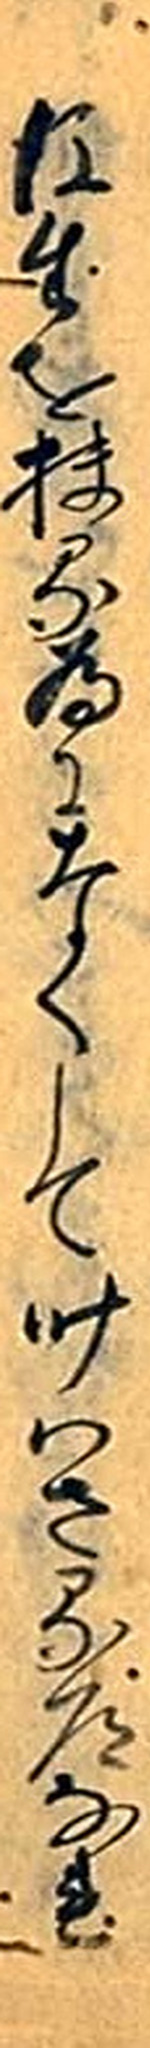後生を扶る為になくして叶はさる道なれ
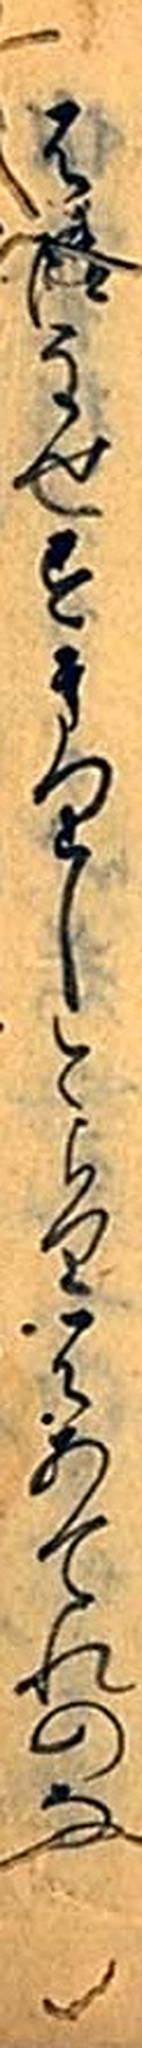は御主せすきりしとよりはあてれのな
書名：ドチリナ・キリシタン
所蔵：東京大学総合図書館 / General Library in the University of Tokyo
